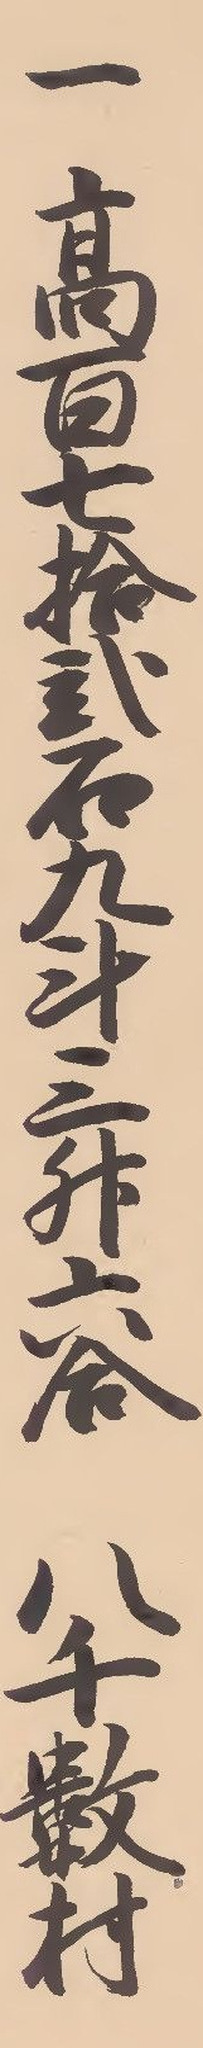一髙百七拾弐石九斗三升六合八千數村

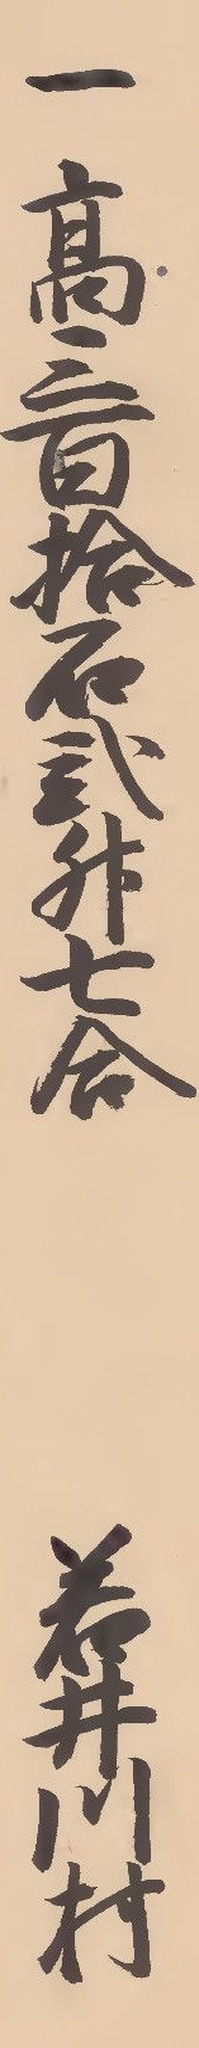一髙三百拾石弐升七合若井川村
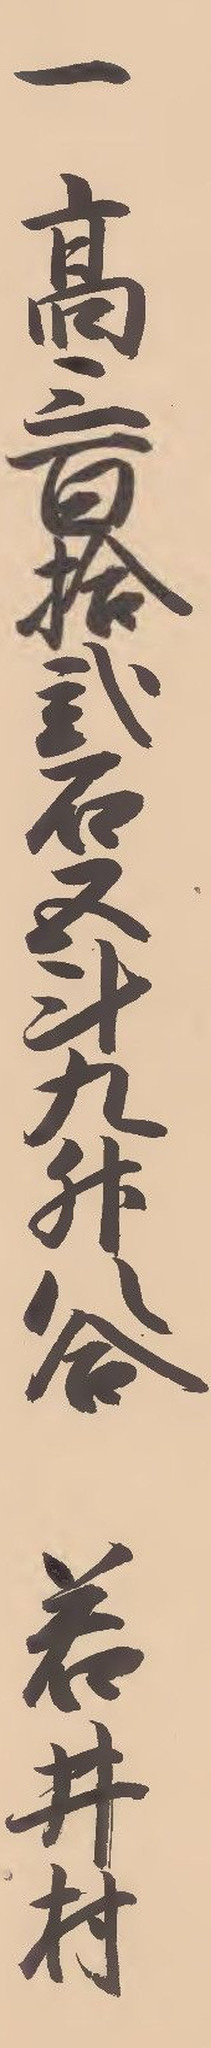一髙三百拾弐石五斗九升八合若井村
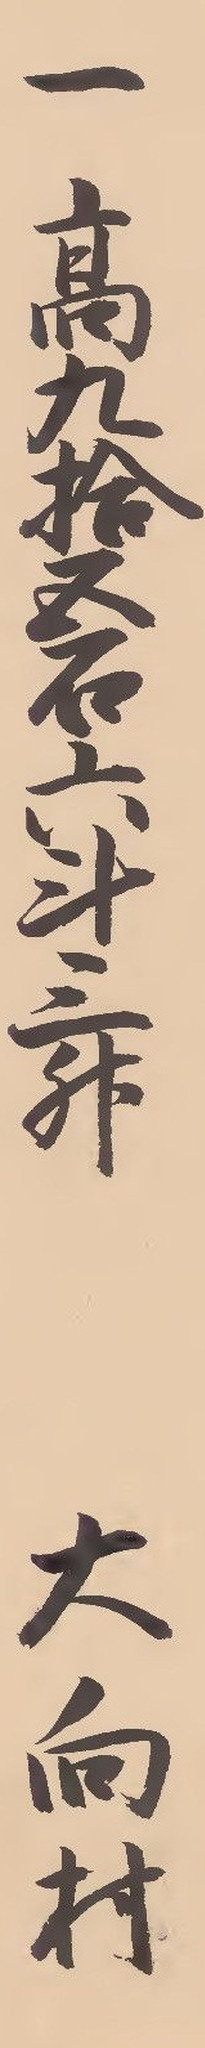一髙九拾五石六斗三升大向村
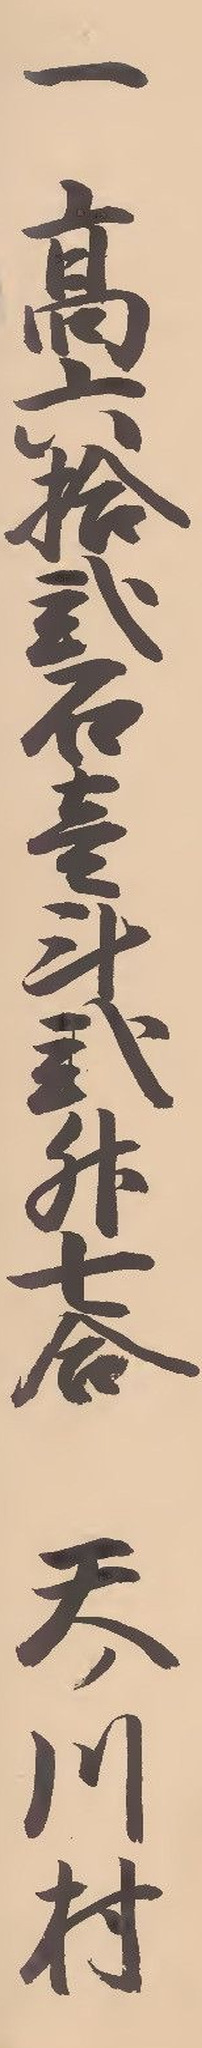一髙六拾弐石壱斗弐升七合天ノ川村
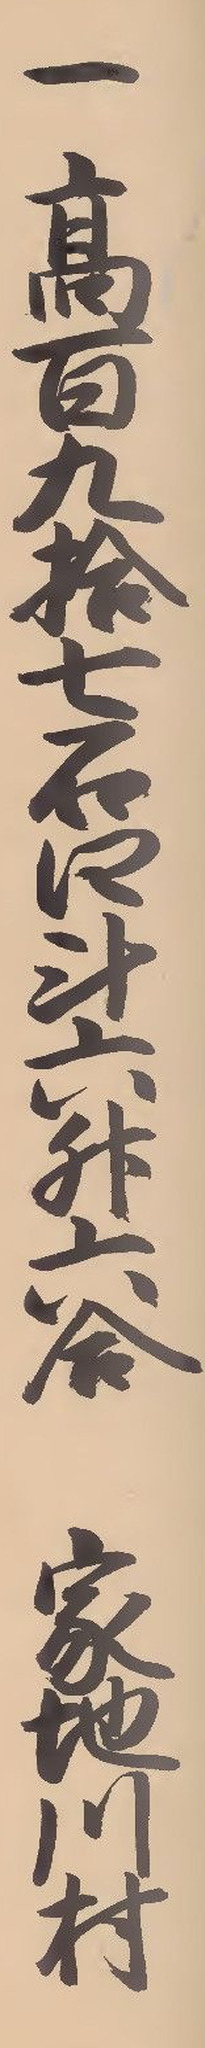一髙百九拾七石四斗六升六合家地川村
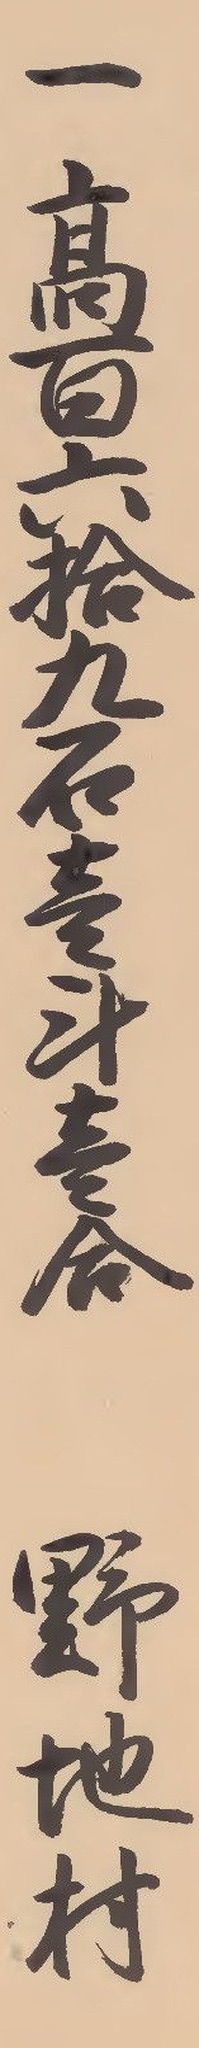一髙百六拾九石壱斗壱合野地村
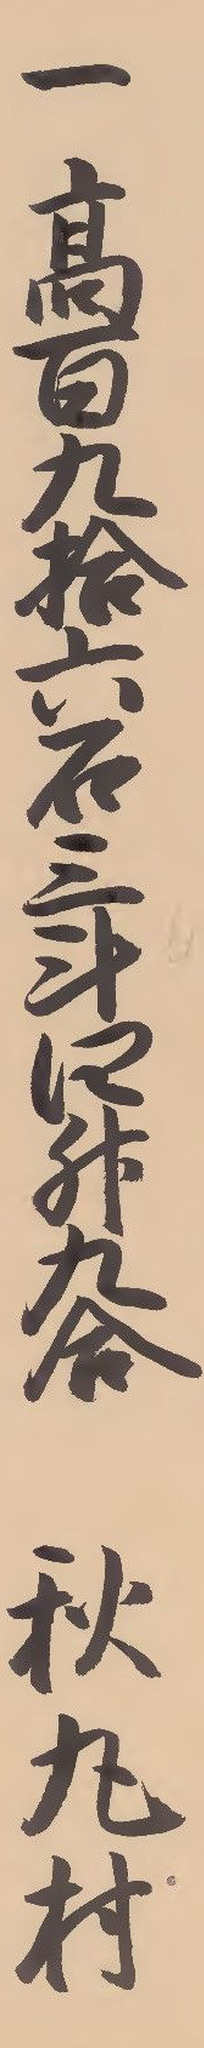一髙百九拾六石三斗四升九合秋丸村
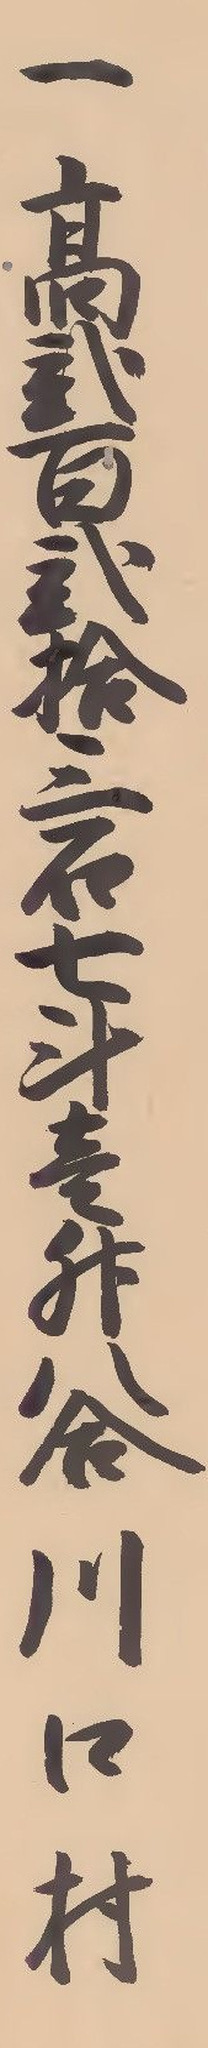一髙弐百弐拾三石七斗壱升八合川口村

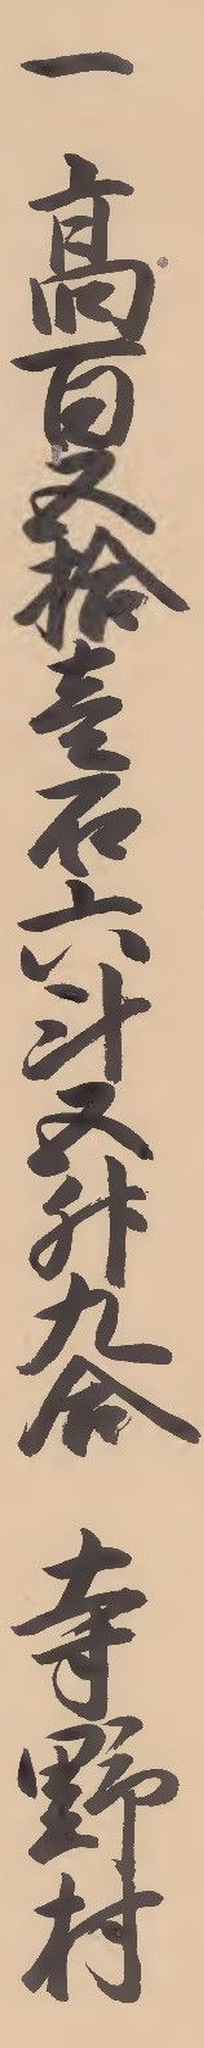一髙百五拾壱石六斗五升九合寺野村
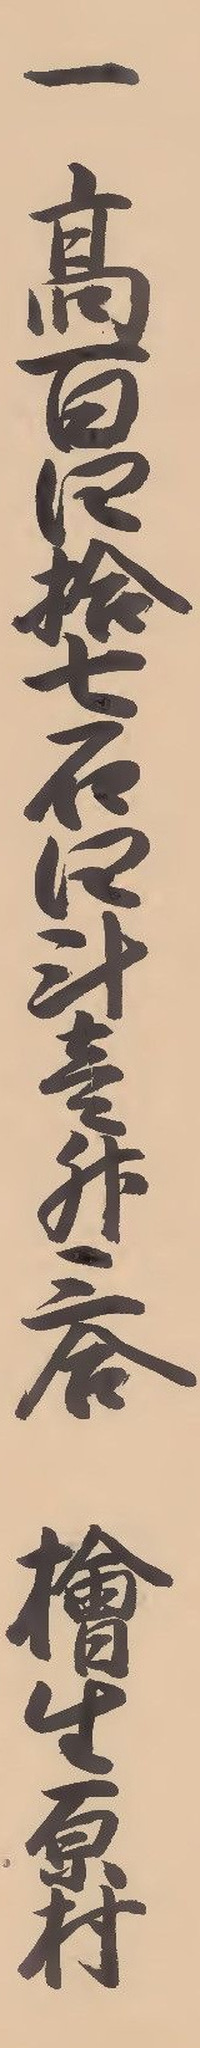一髙百四拾七石四斗壱升三合檜生原村
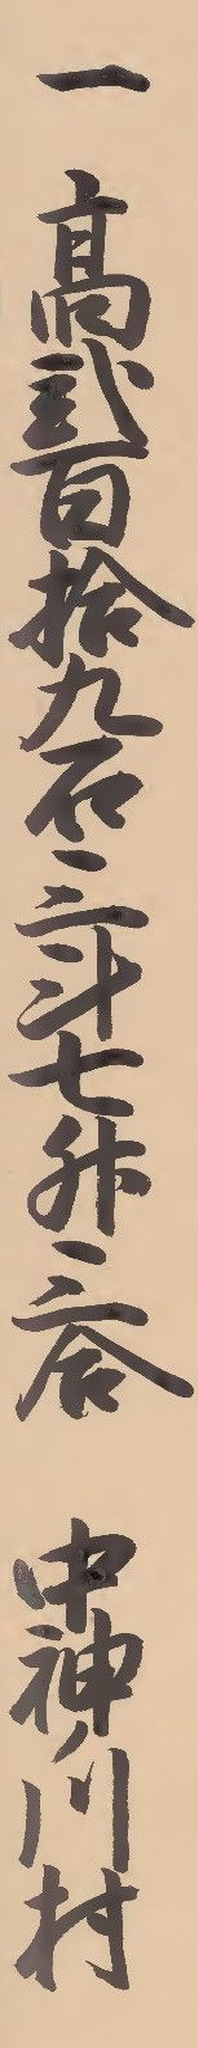一髙弐百拾九石三斗七升三合中神ノ川村
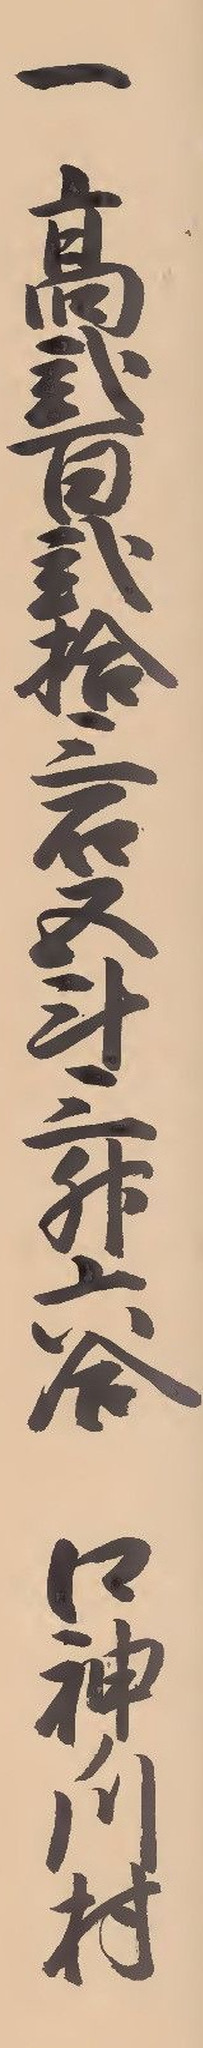一髙弐百弐拾三石五斗三升六合口神ノ川村
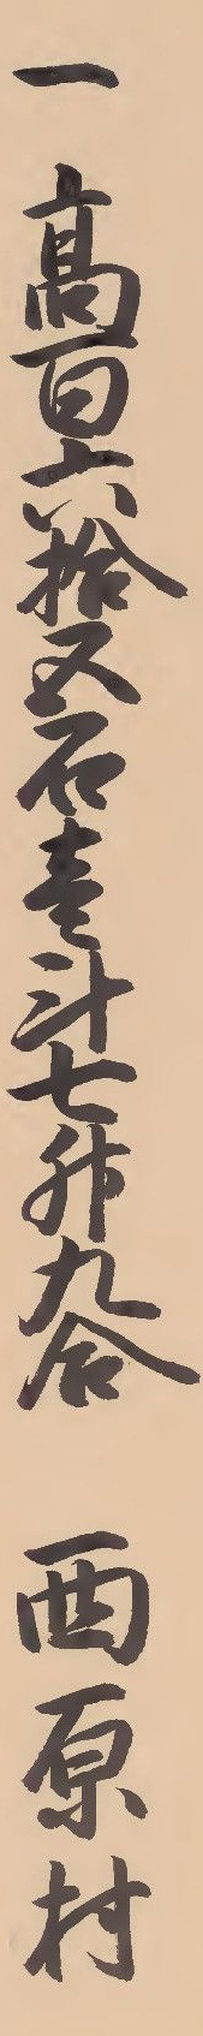一髙百六拾五石壱斗七升九合西原村
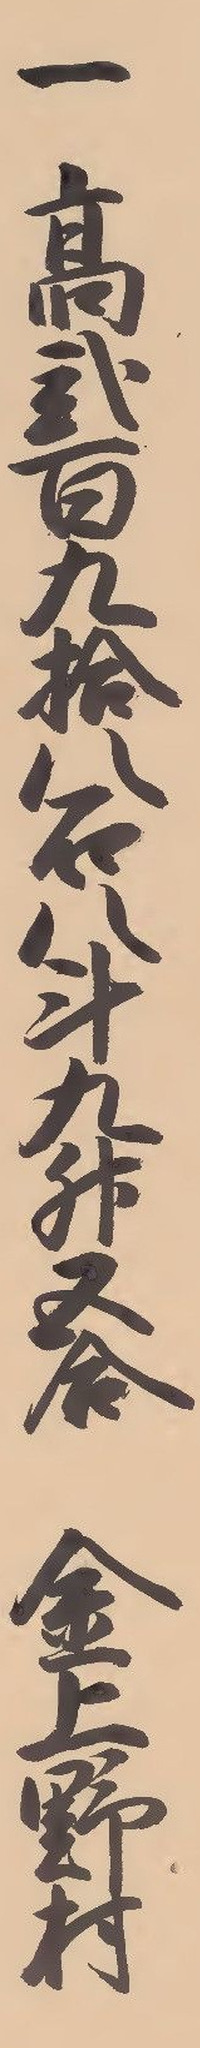一髙弐百九拾八石八斗九升五合金上野村
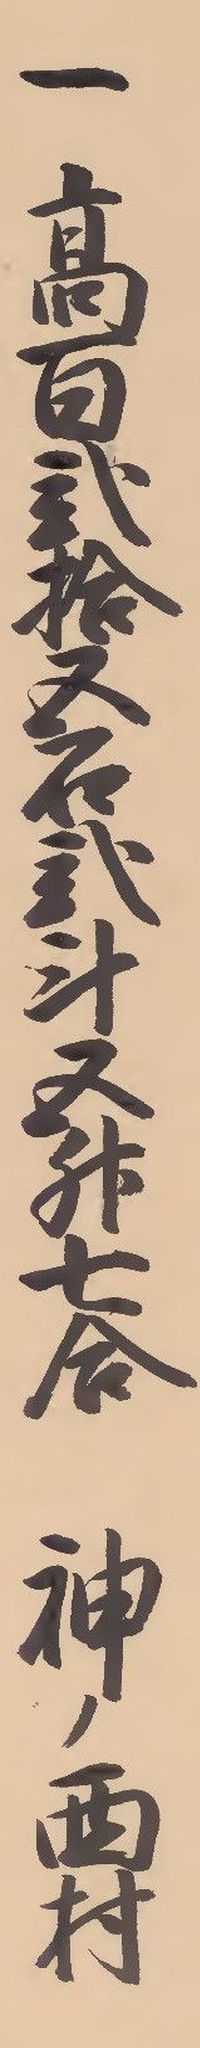一髙百弐拾五石弐斗五升七合神ノ西村
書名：土佐国郷帳
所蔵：国立公文書館 National Archives of Japan
